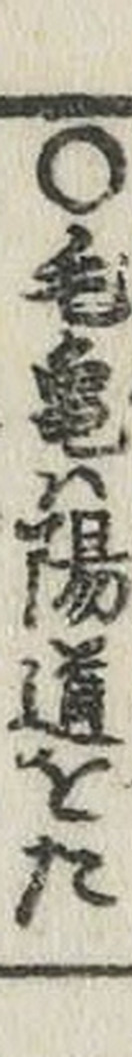○毛亀は陽道をた
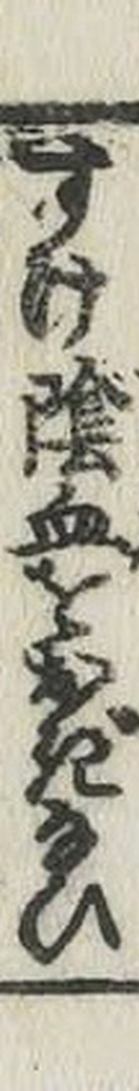すけ陰血をおぎなひ
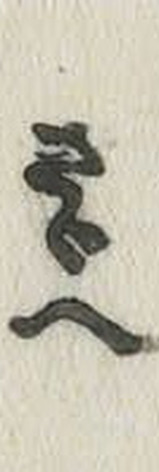さゞへ
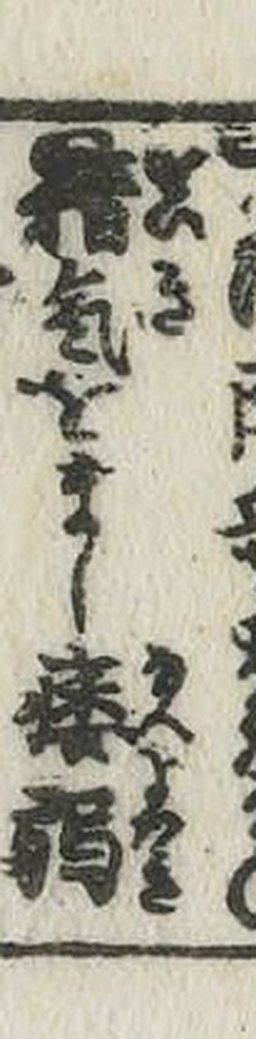精気をまし痿弱
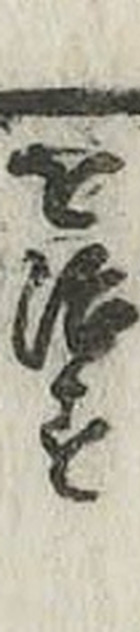を治す
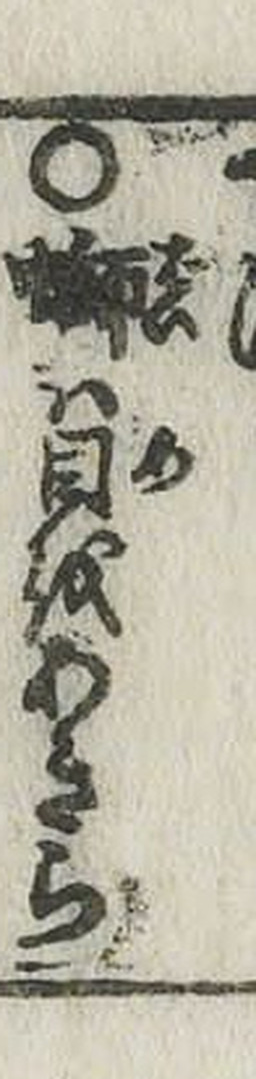○螄は目をあきら
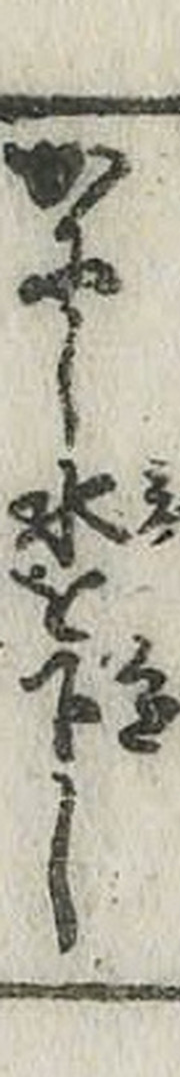かにし水を下し
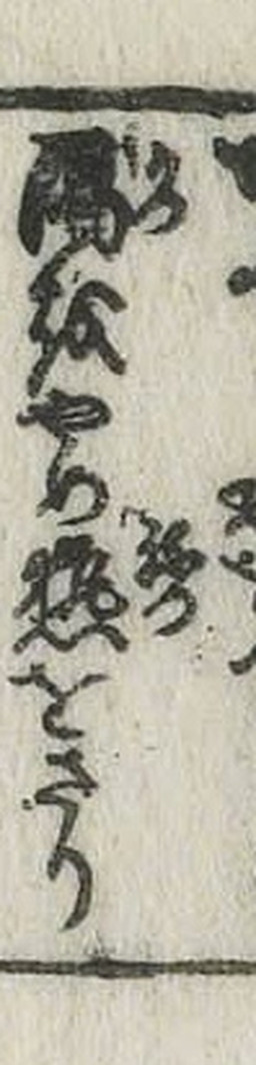渇をやめ熱をさり
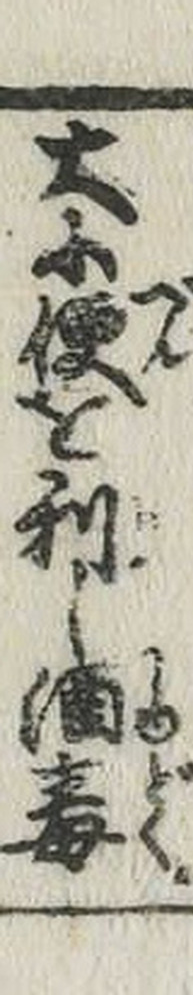大小便を利し酒毒

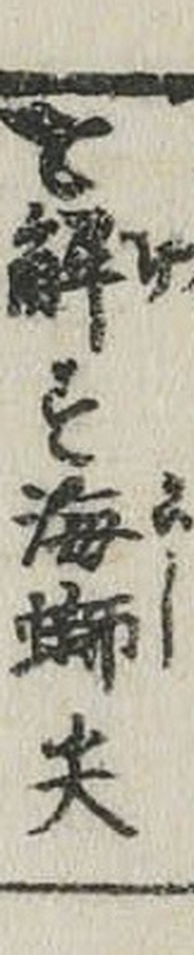を解す海螄尖
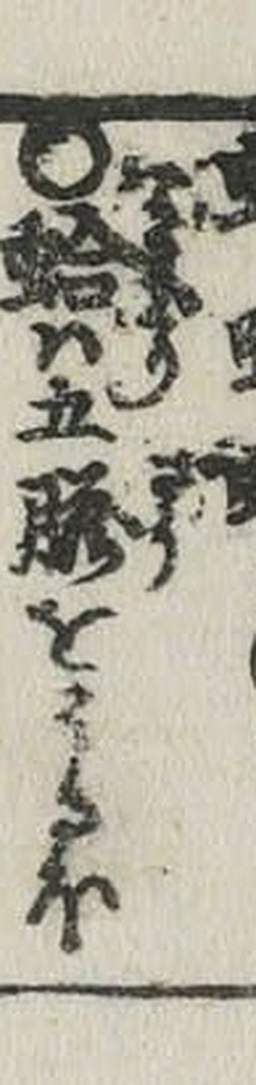○蛤は五臓をうるほ
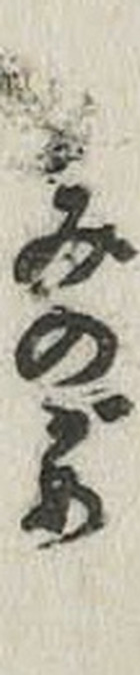みのがめ
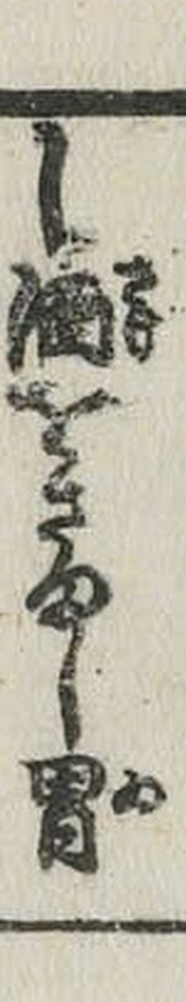し酒をさまし胃
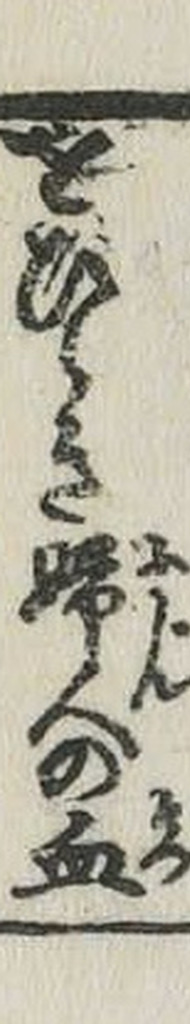をひらき婦人の血
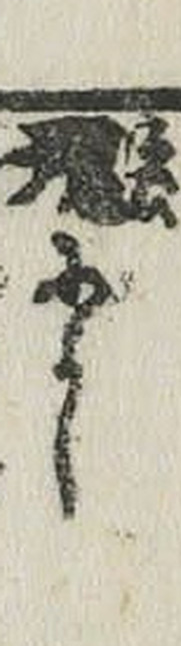塊によし
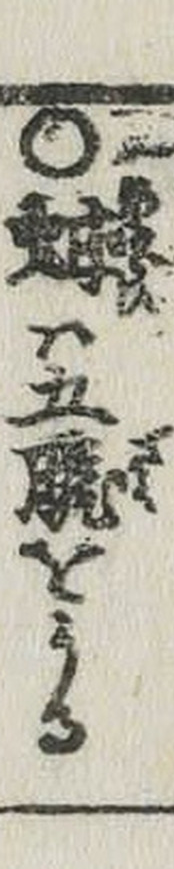○蚶は五臓をうる
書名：増補頭書訓蒙図彙大成 10巻 7:巻之14-16
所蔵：東京学芸大学教育コンテンツアーカイブ
